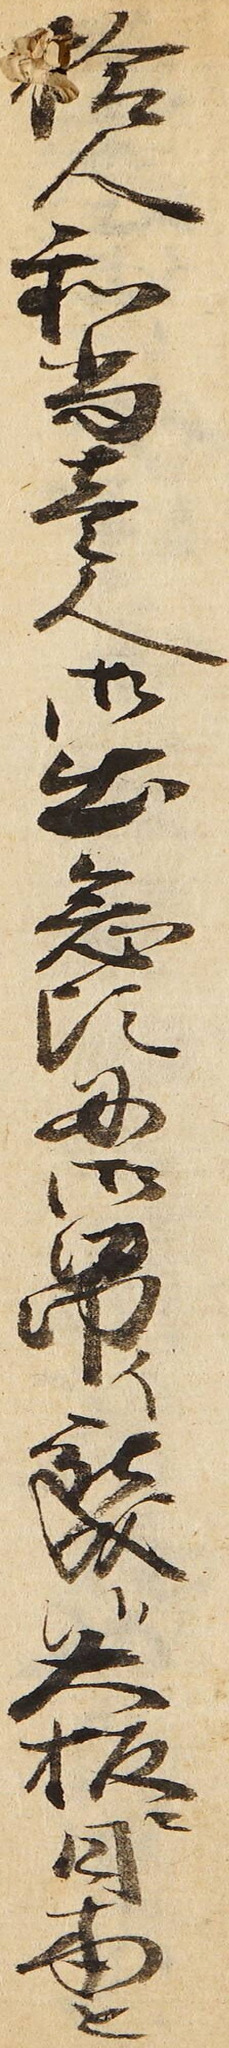拾人和尚壱人御出念頃に御弔い被成候大板に日本と
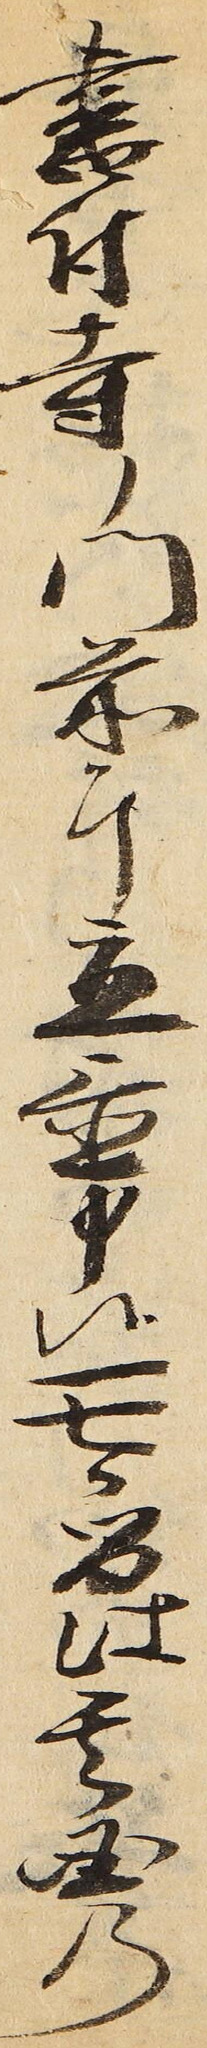書付寺の門前に立置申候一七日留仕其国の
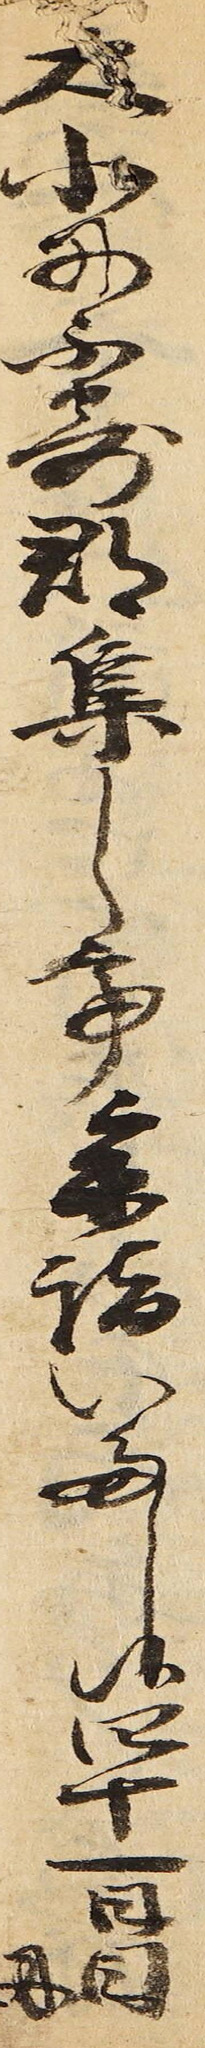大小に不寄群集して参詣いたし候四十一日目に
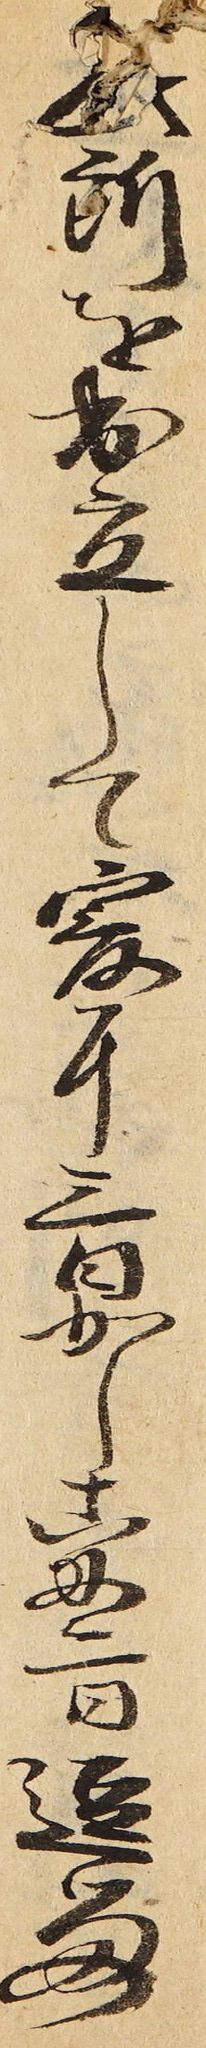所を出立して爰に三日かしこに二日逗留
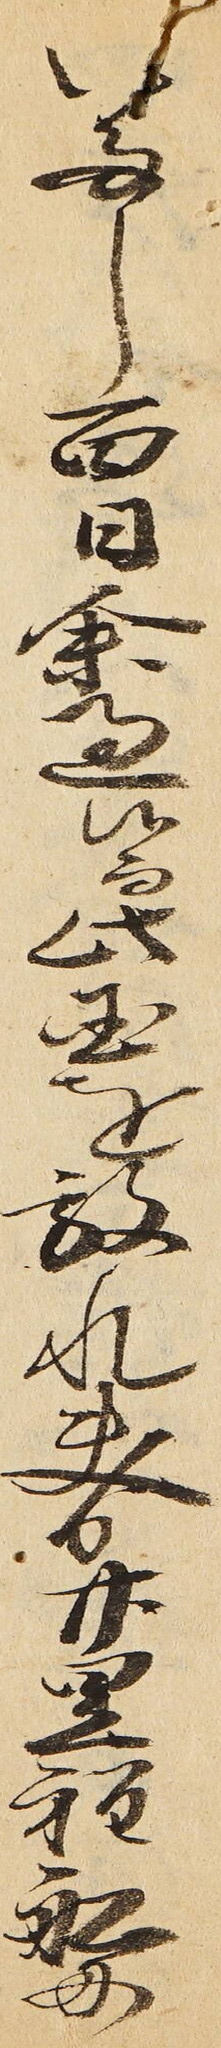いたし百日余過候て此国を放れ夫ゟ廿里程船に
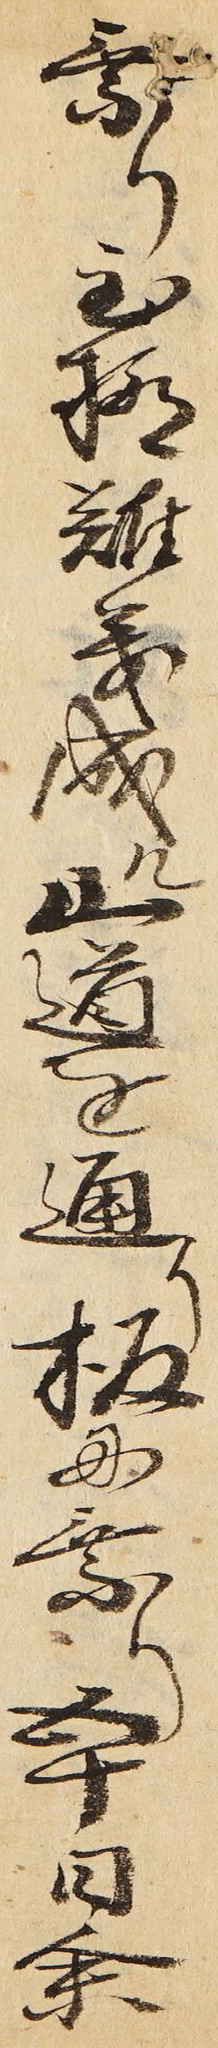乗り至極難義成る山道を通り板に乗り五十日余
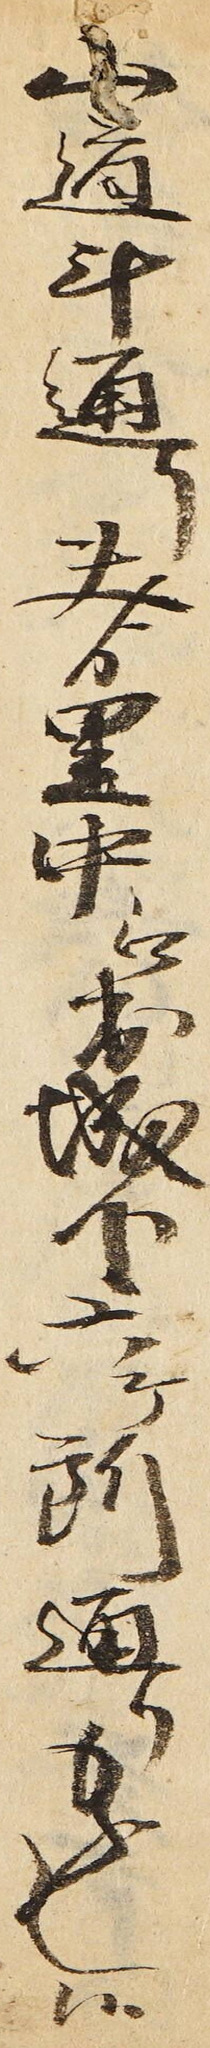山道計通り夫ゟ里中え出城下六ヶ所通りもふし候
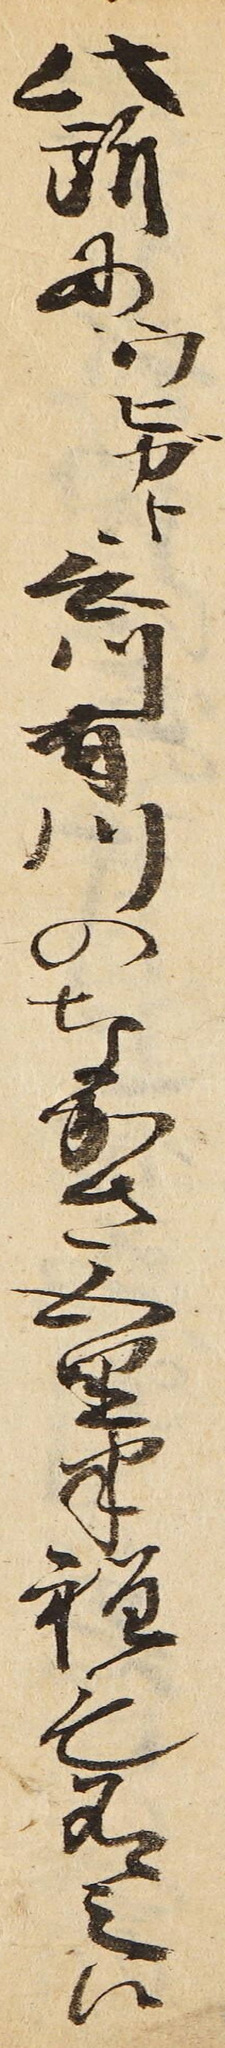此所にウヒガト言川有川のなかさ五里半程も有之候
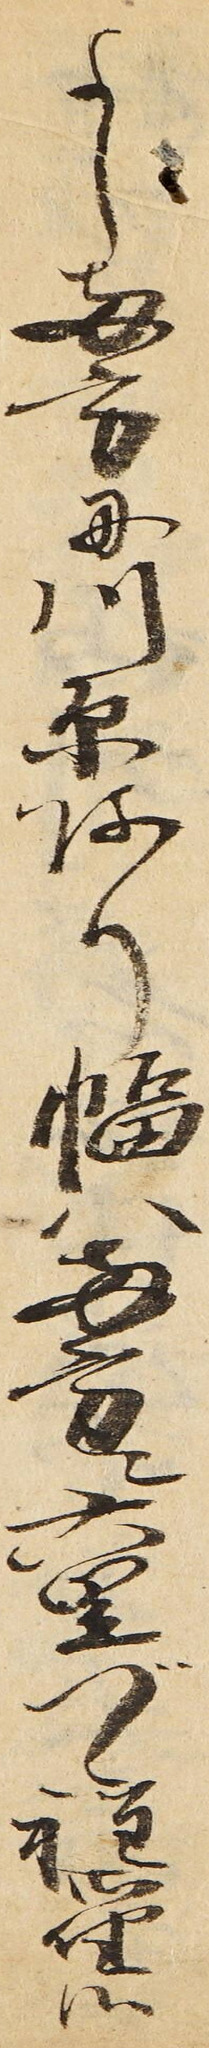よし両方に川原あり幅は両方に六里づゝ程御座候
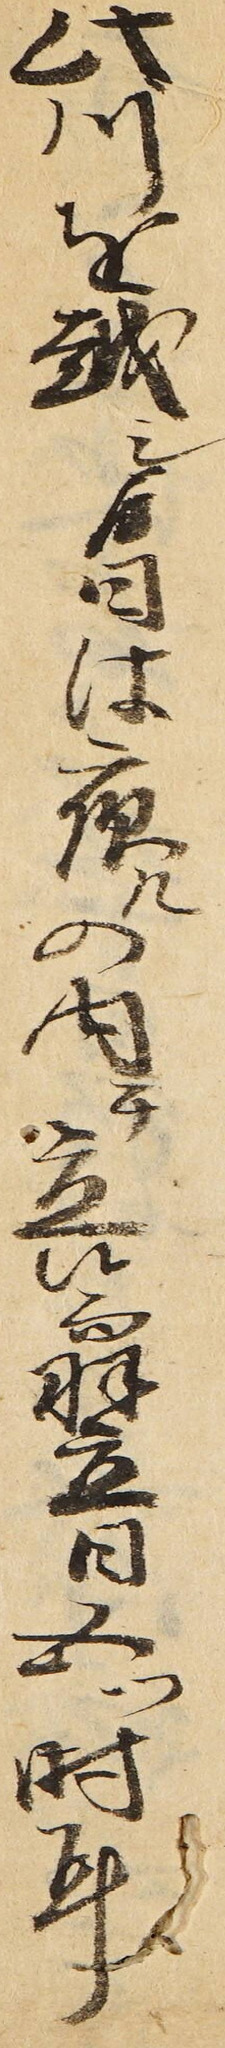此川を越し候日は夜るの内ち立候て翌日五ツ時に
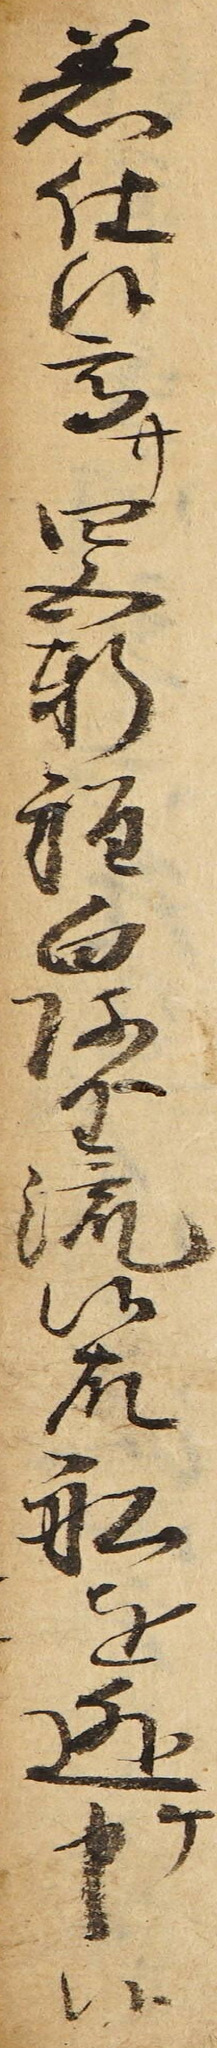着仕候高さ四五軒程白あわ流候故船を逃け申候

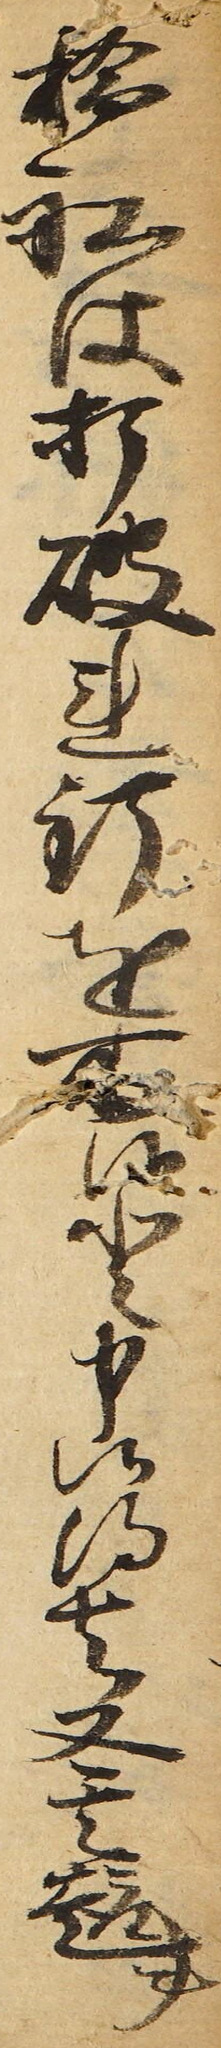橋船は打破れ釘を取候と申候得は又其趣を
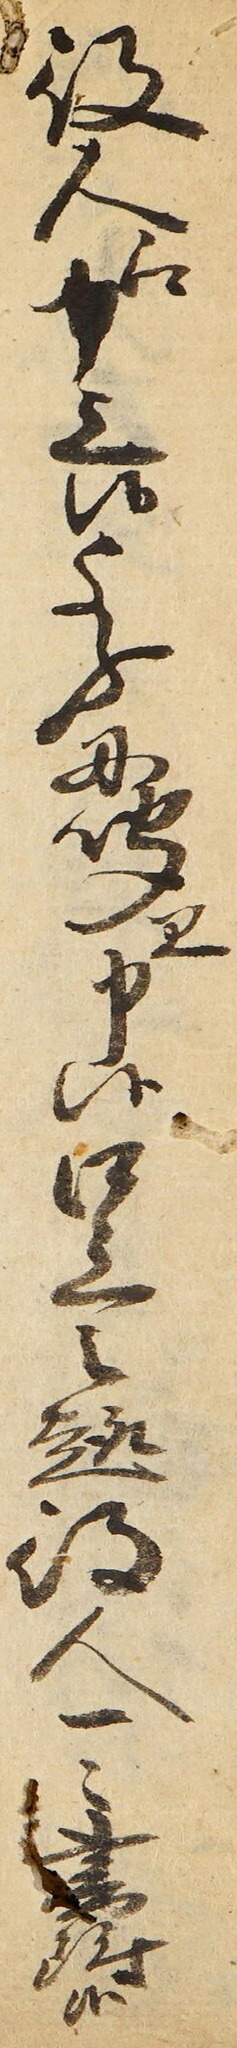役人え申上候よふに聞ゑ申候口上之趣役人一々書附候
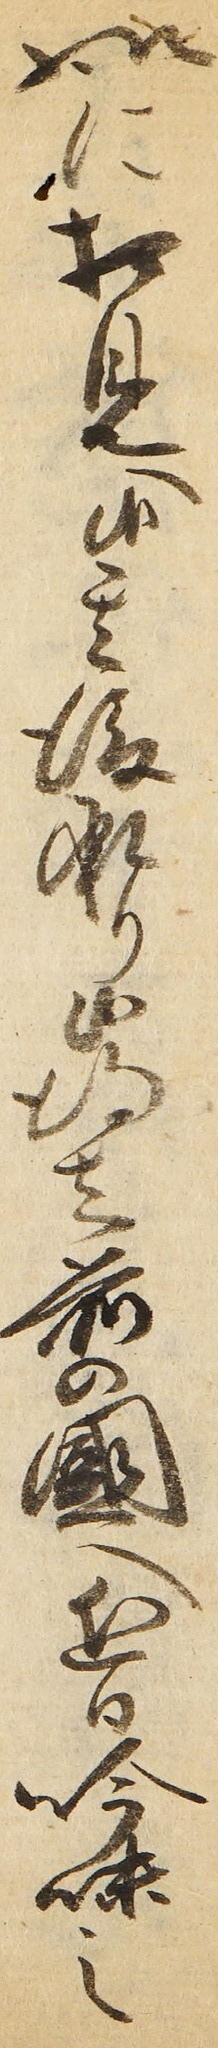様に相見へ候其後承り候得は前の国へ近日吟味之
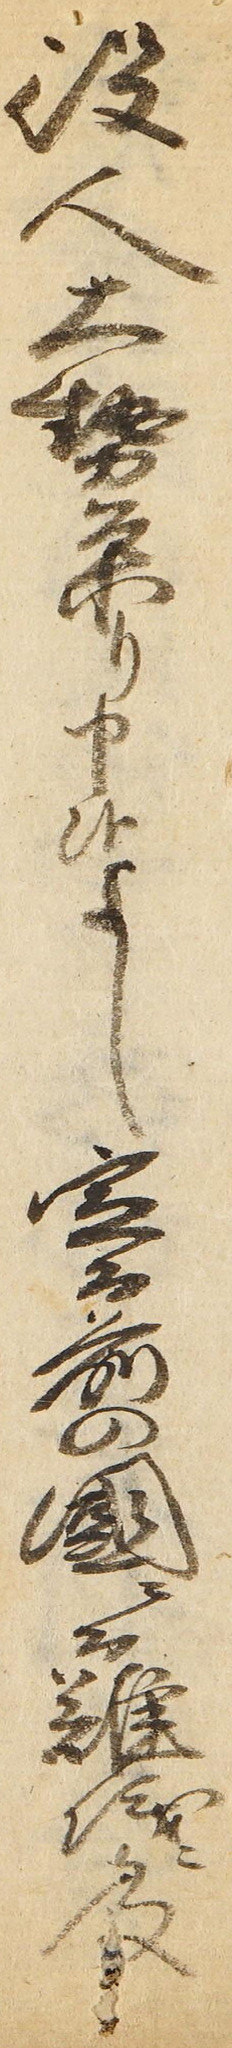役人大勢参り申候よし定而前の国にて難義に及
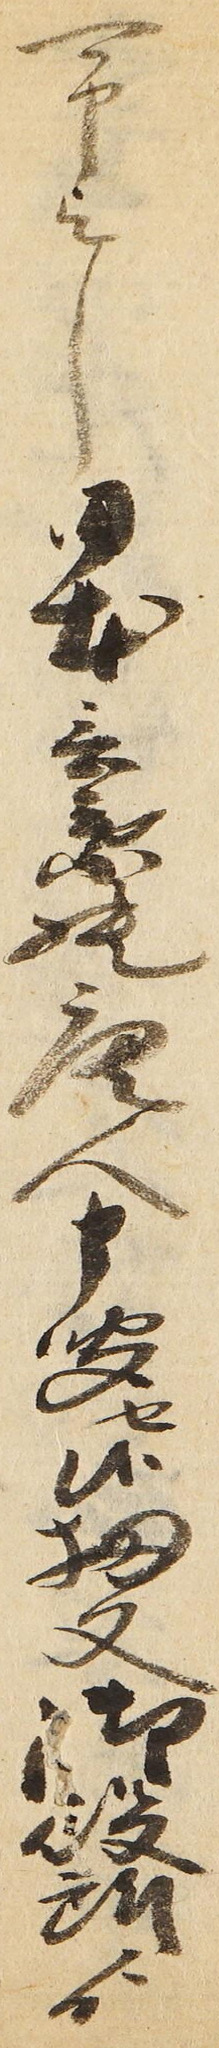可申よし日本言葉の唐人申聞せ候扨又御役所ゟ
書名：志州鳥羽流船留書
